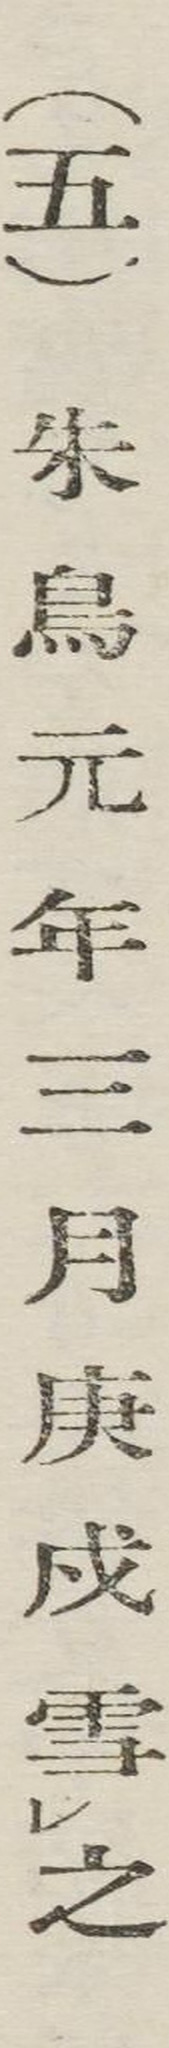朱鳥元年三月庚戌雪之
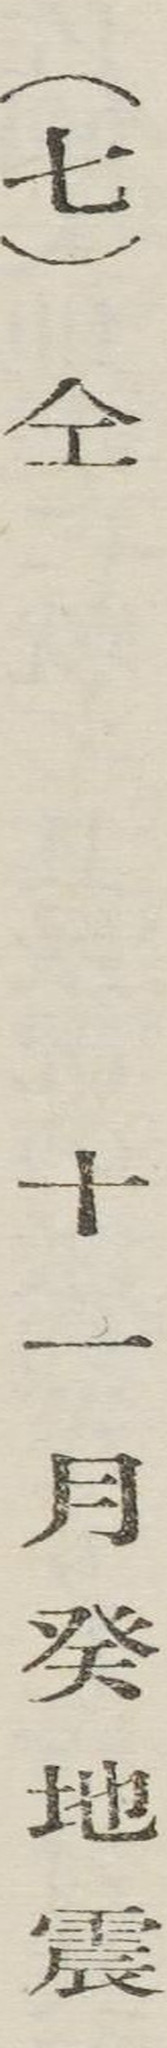同十一月癸地震
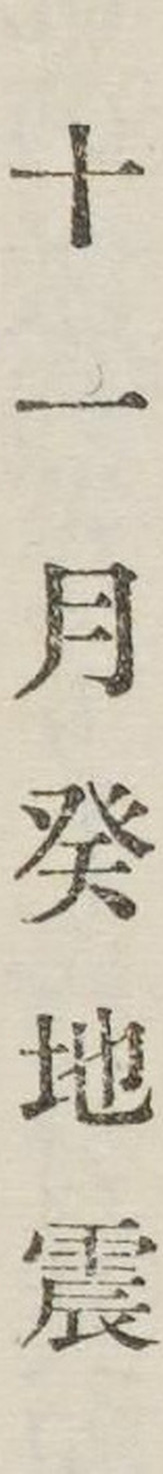同十一月癸地震
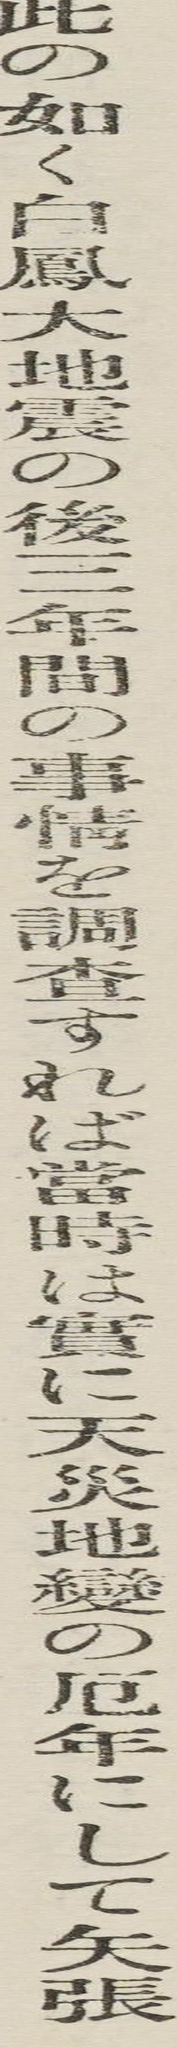此の如く白鳳大地震の後三年間の事情を調査すれば当時は実に天災地変の厄年にして矢張
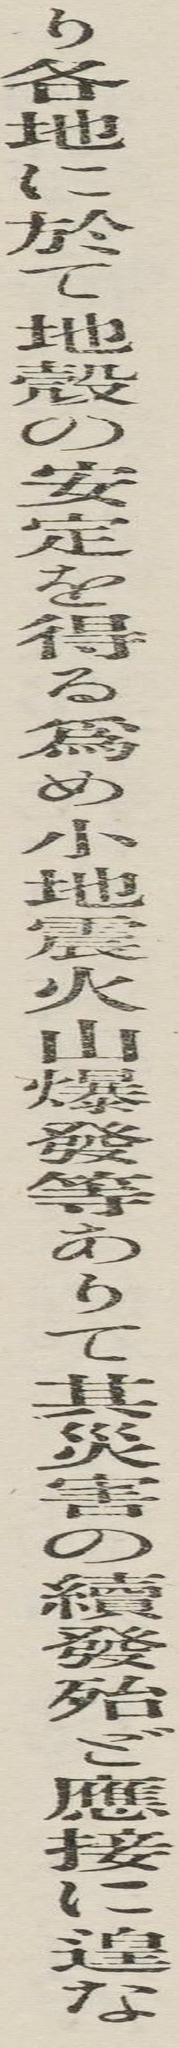り各地に於て地殻の安定を得る為め小地震火山爆発等ありて其災害の続発殆ど応接に遑な
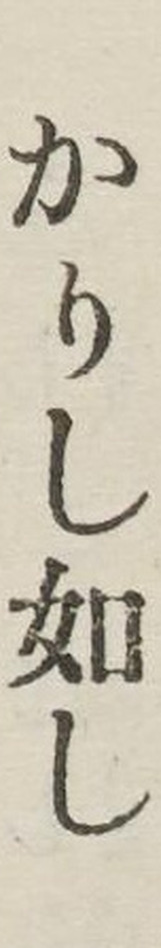かりし如し
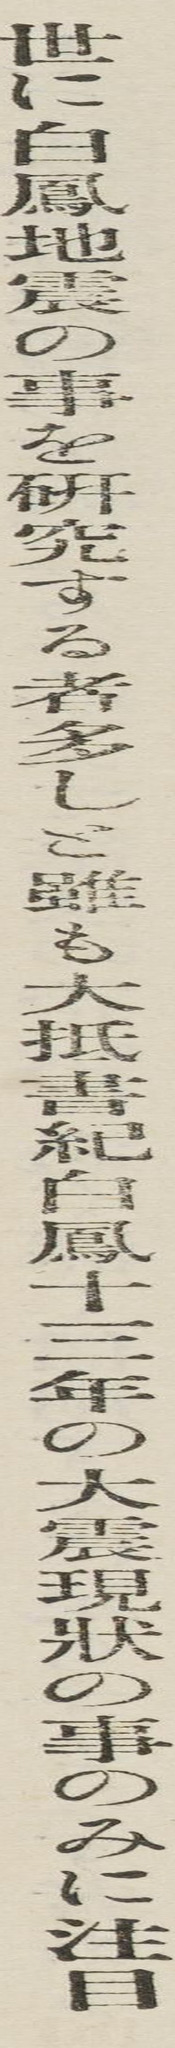世に白鳳地震の事を研究する者多しと雖も大抵書紀白鳳十三年の大震現状の事のみに注目

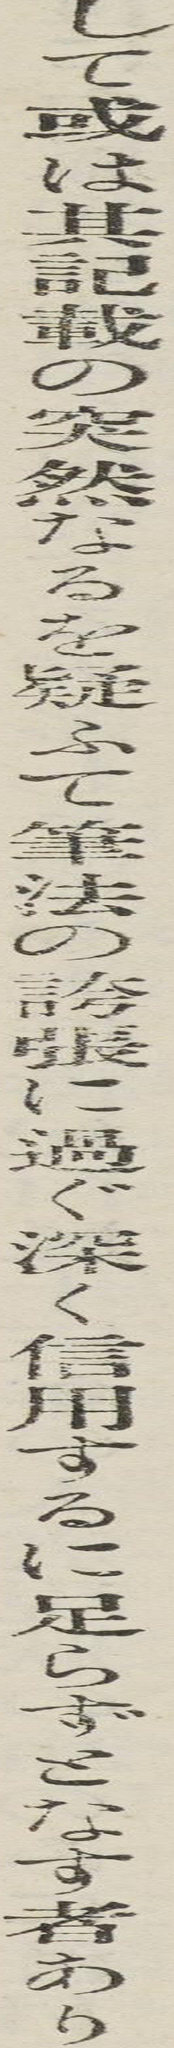して或は其記載の突然なるを疑ふて筆法の誇張に過ぐ深く信用するに足らずとなす者あり
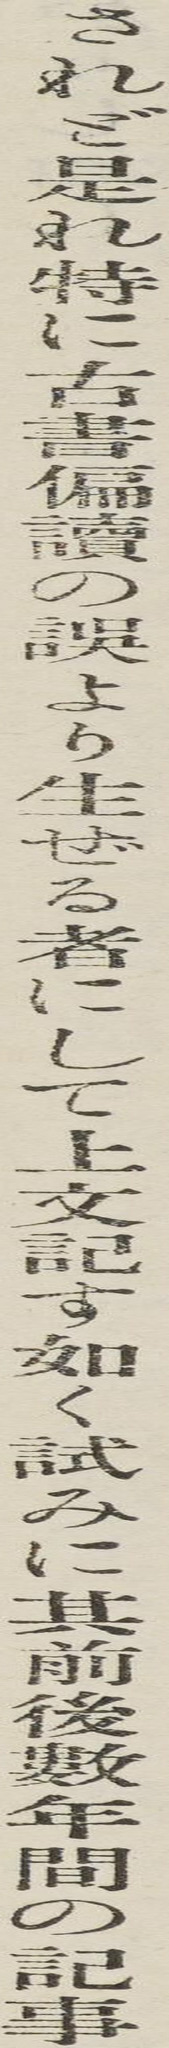されど是れ特に古書偏読の誤より生ぜる者にして上文記す如く試みに其前後数年間の記事
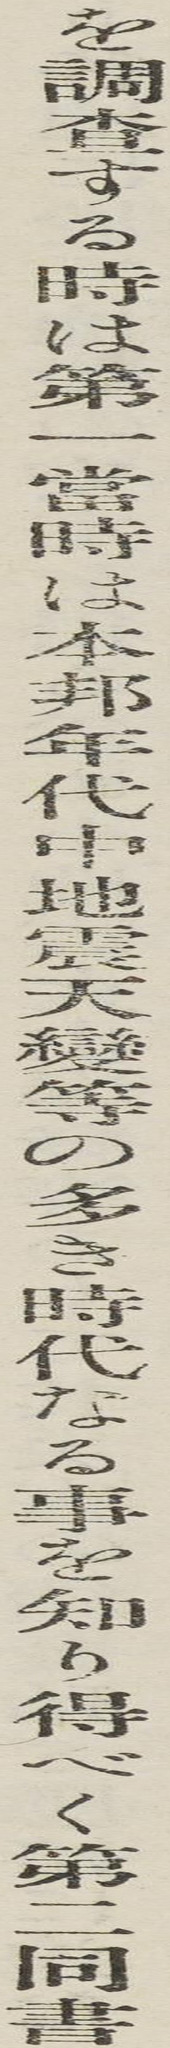を調査する時は第一当時は本邦年代中地震天変等の多き時代なる事を知り得べく第二同書
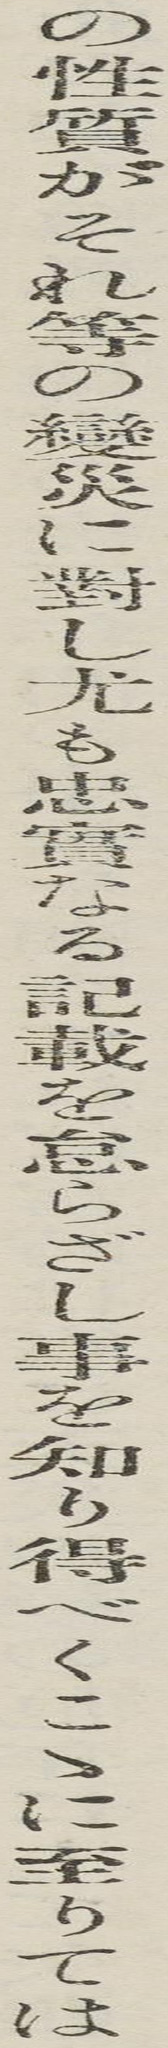の性質がそれ等の変災に対し尤も忠実なる記載を怠らざし事を知り得べくこゝに至りては
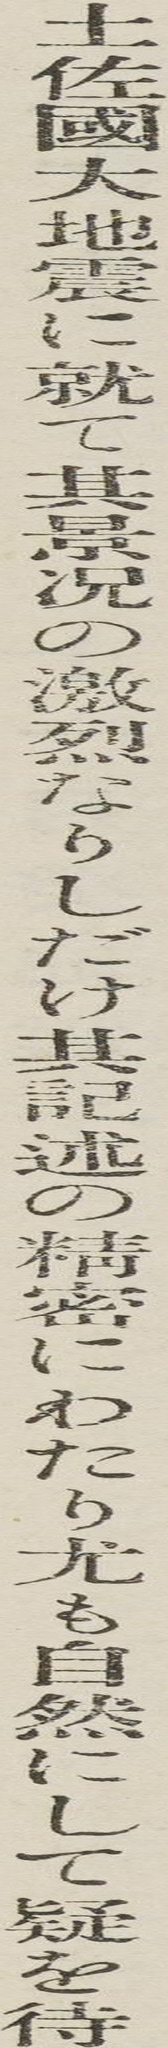土佐国大地震に就て其景況の激烈なりしだけ其記述の精密にわたり尤も自然にして疑を待
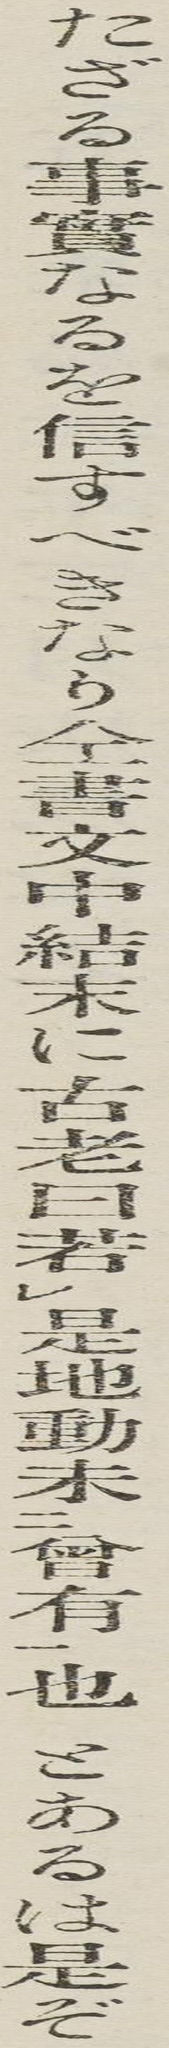たざる事実なるを信すべきなり同書文中結末に古老曰若是地動未曾有也とあるは是ぞ
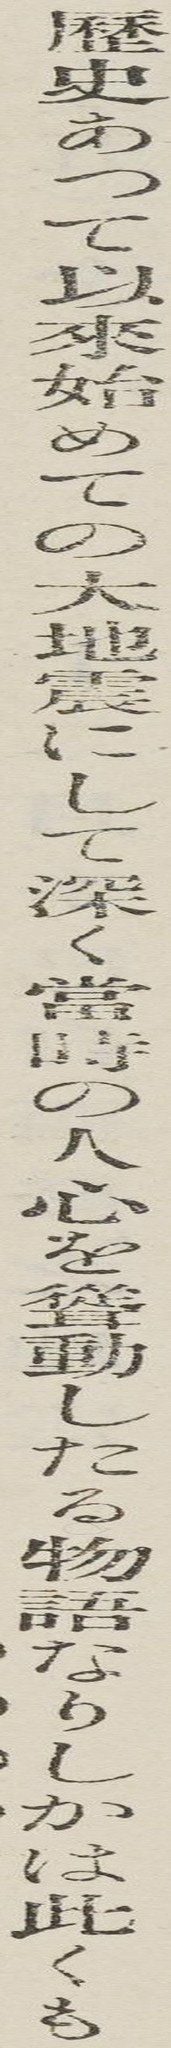歴史あつて以来始めての大地震にして深く当時の人心を聳動したる物語なりしかは此くも
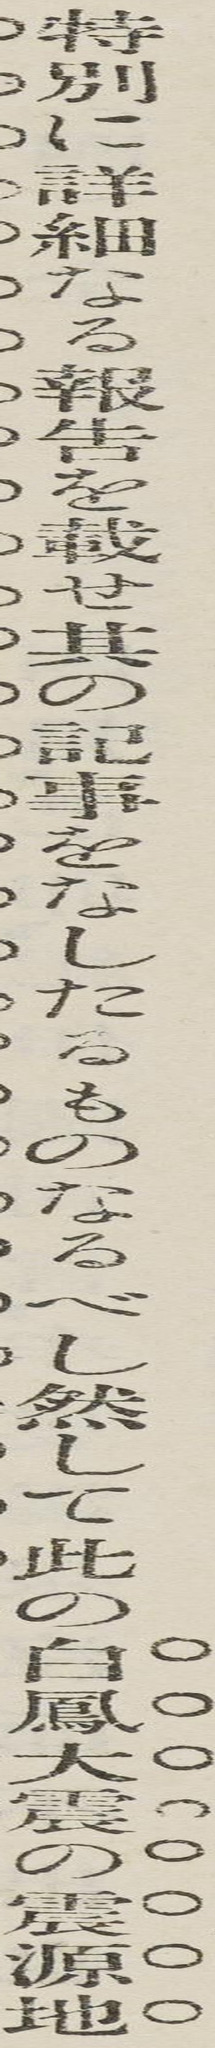特別に詳細なる報告を載せ其の記事をなしたるものなるべし然して此の白鳳大震の震源地
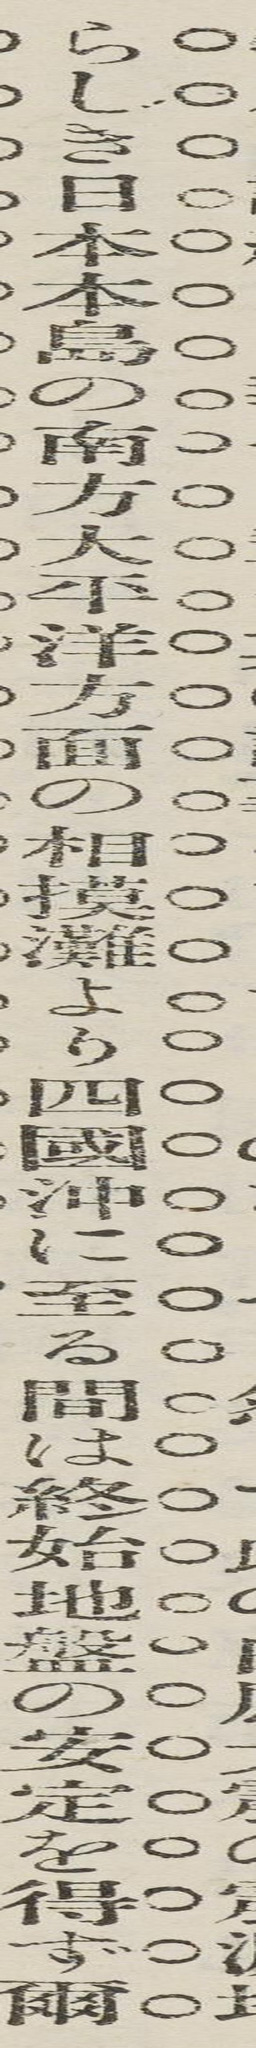らしき日本本島の南方太平洋方面の相模灘より四国沖に至る間は終始地盤の安定を得ず爾
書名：土佐古今ノ地震
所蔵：東京大学地震研究所図書室 Earthquake Research Institute Library, The University of Tokyo, JAPAN
